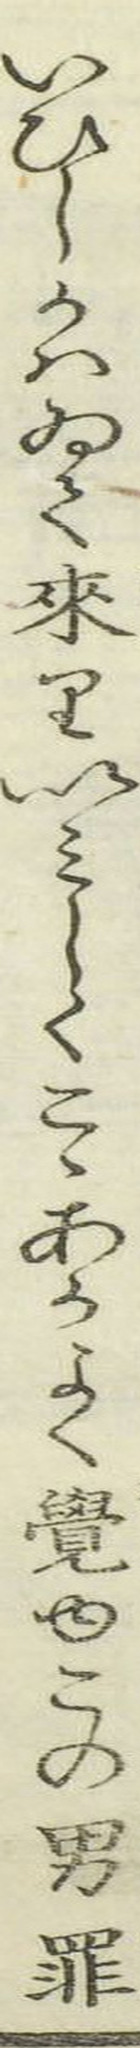いひしかはゐて來りいみしくこゝあかよく覚ゆこの男罪
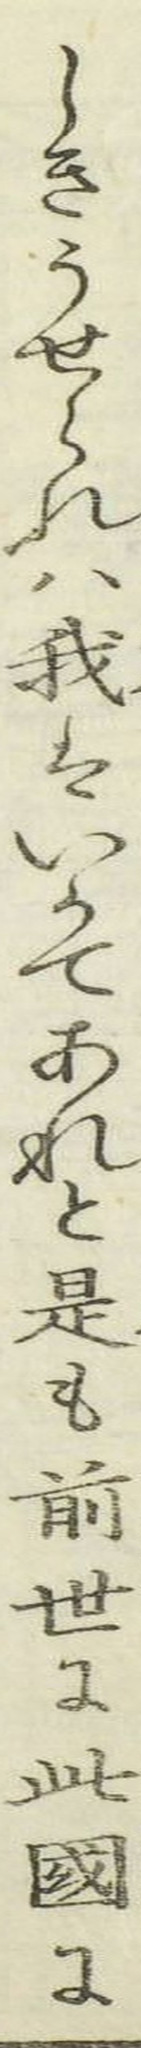しきうせられは我はいかてあれと是も前世に此國に
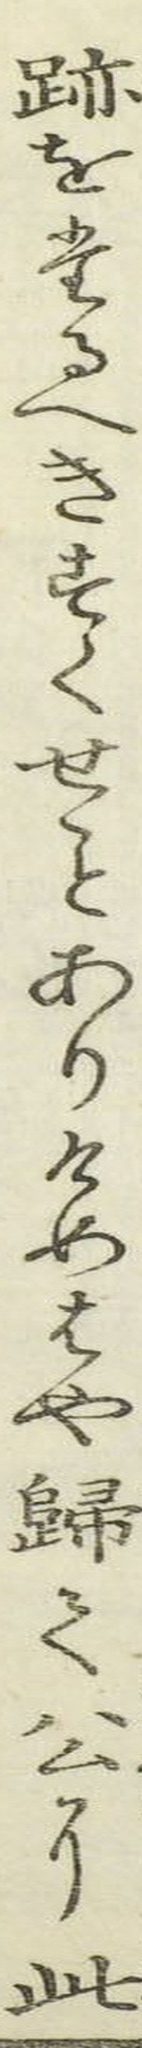跡をたるへきすくせことありけめはや帰て公に此
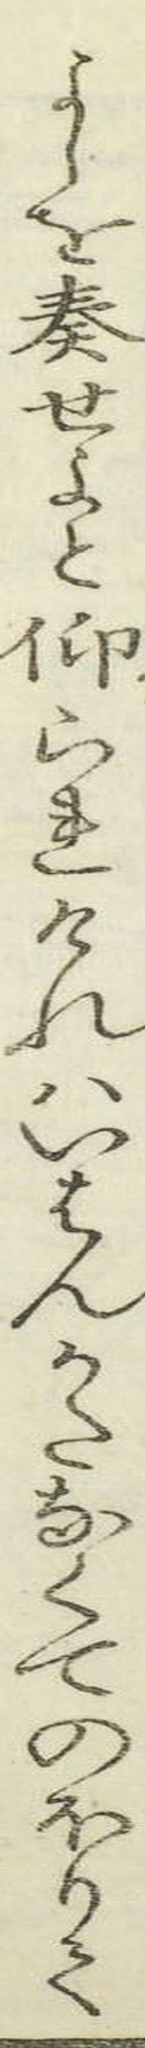よしを奏せよと仰られけれはいはんかたなくてのほりて
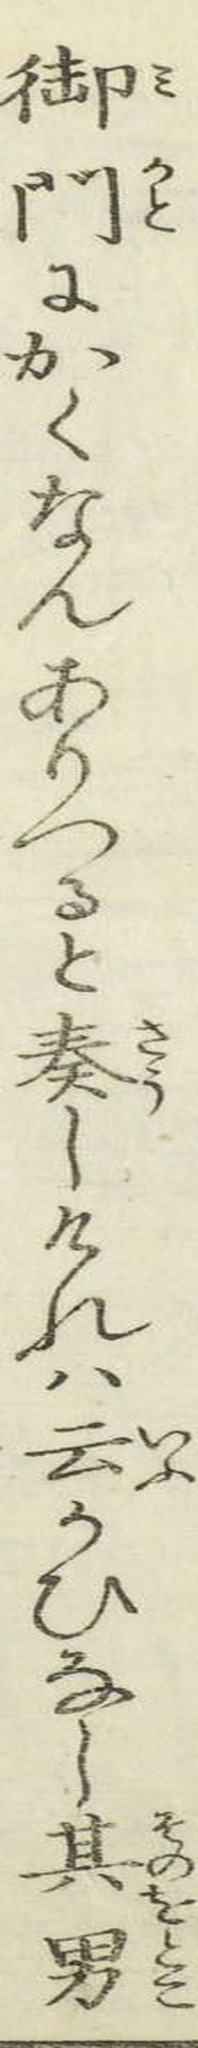御門にかくなんありつると奏しけれは云かひなし其男
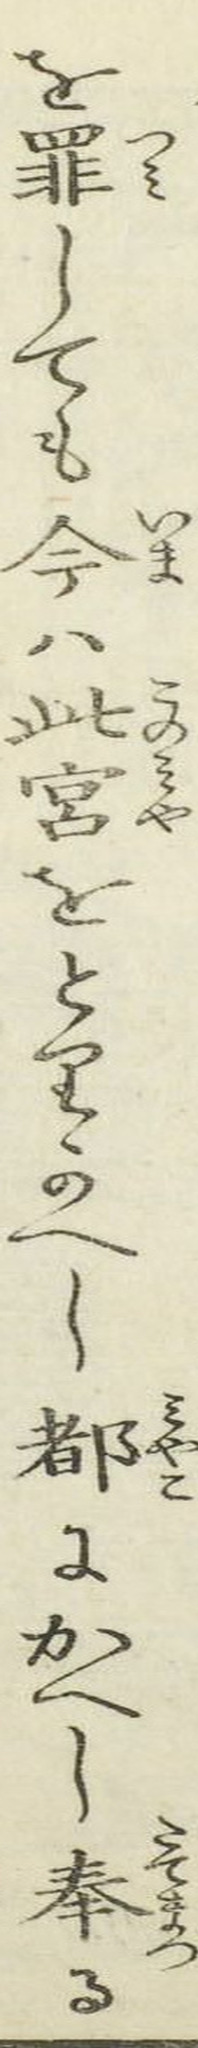を罪しても今は此宮をとりかへし都にかへし奉る
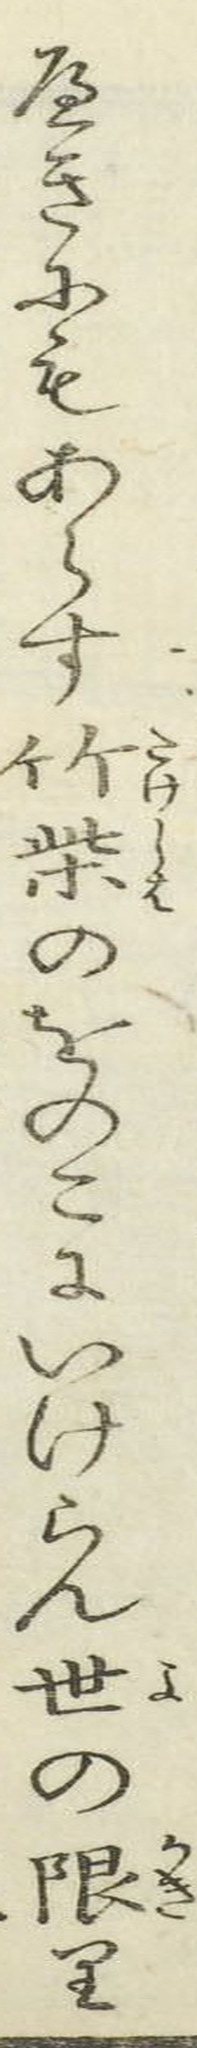へきにもあらす竹柴のをのこにいけらん世の限り
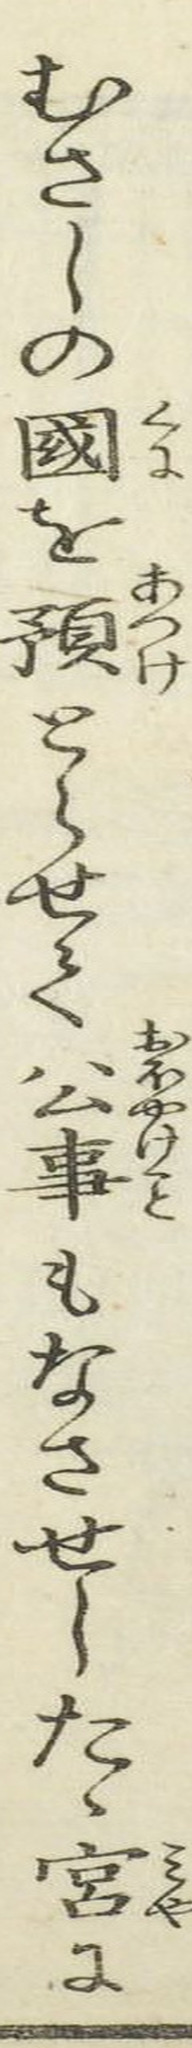むさしの國を預とらせて公事もなさせしたゝ宮に
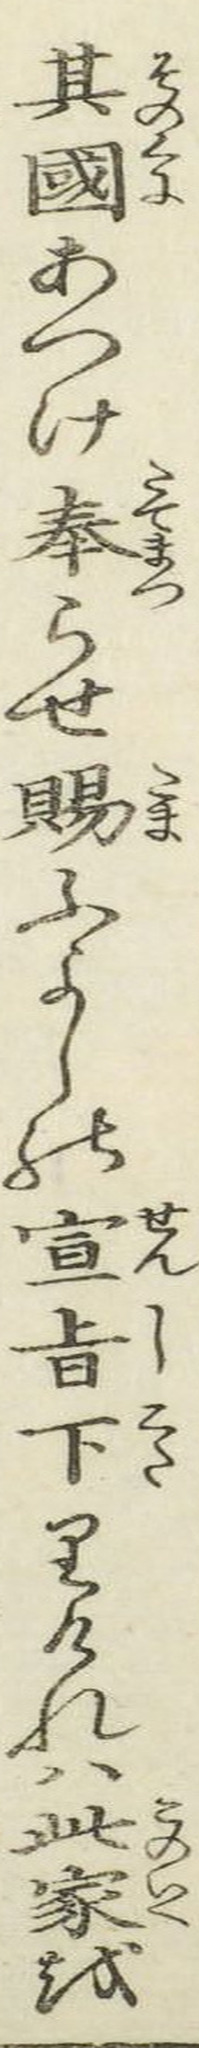其國あつけ奉らせ賜ふよしの宣旨下りけれは此家を
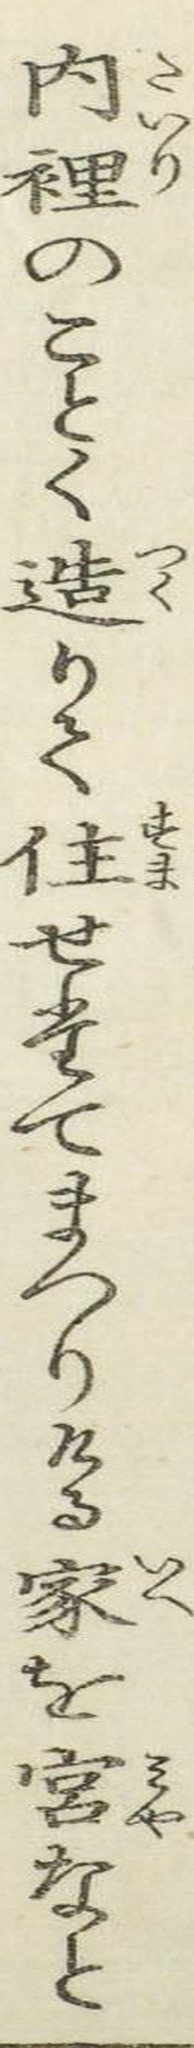内裡のことく造りて住せたてまつりける家を宮なと
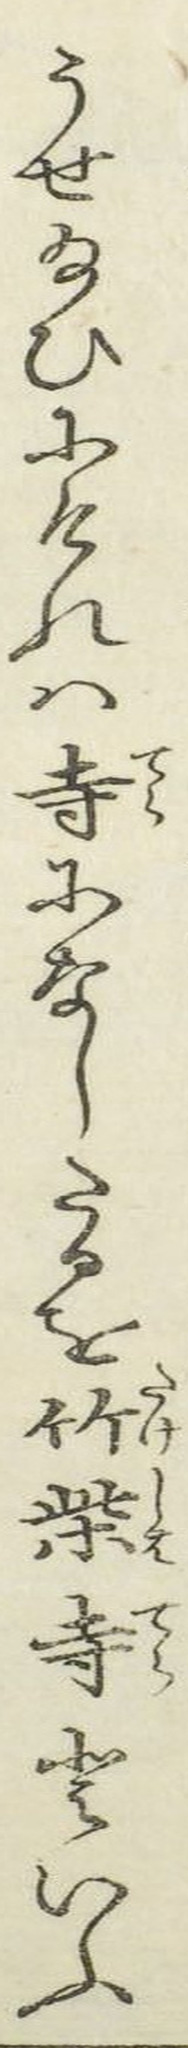うせ給ひにけれは寺になしたるを竹柴寺といふ
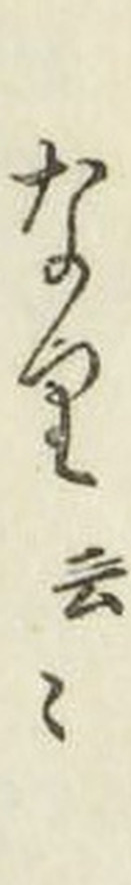なり云々
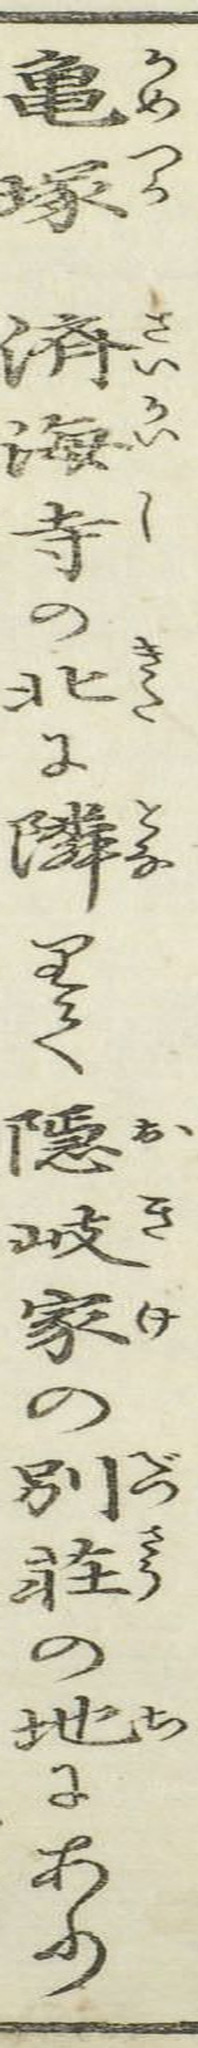亀塚済海寺の北に隣りて隠岐家の別荘の地にあり
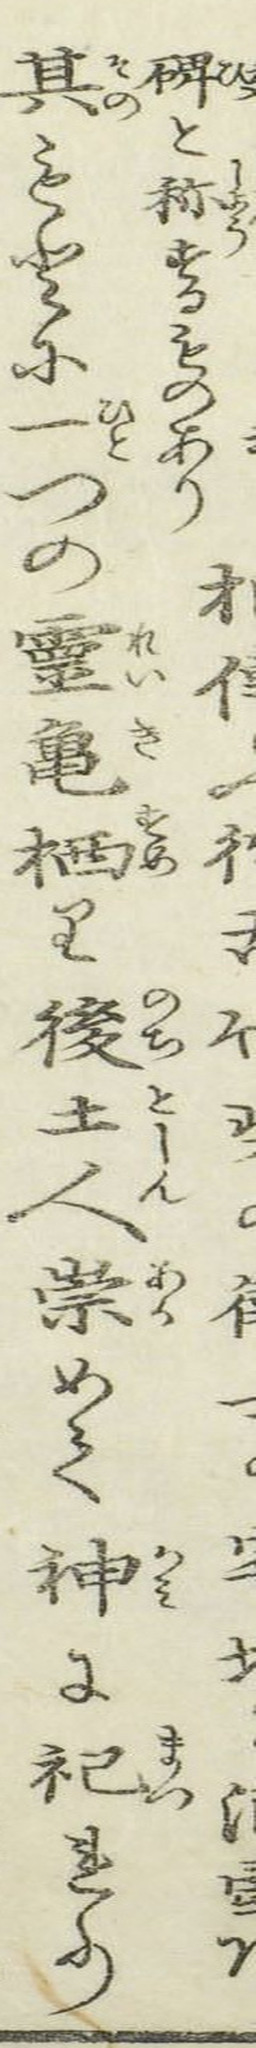其もとに一つの霊亀栖り後土人崇めて神に祀れり
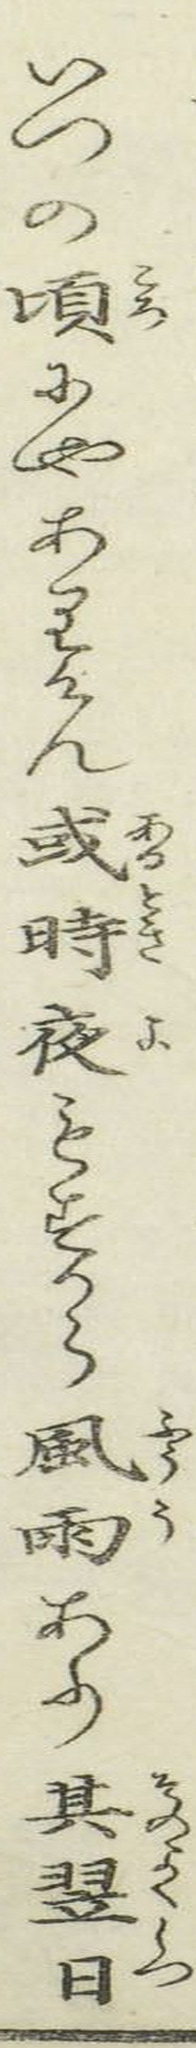いつの頃にやありけん或時夜もすから風雨あり其翌日
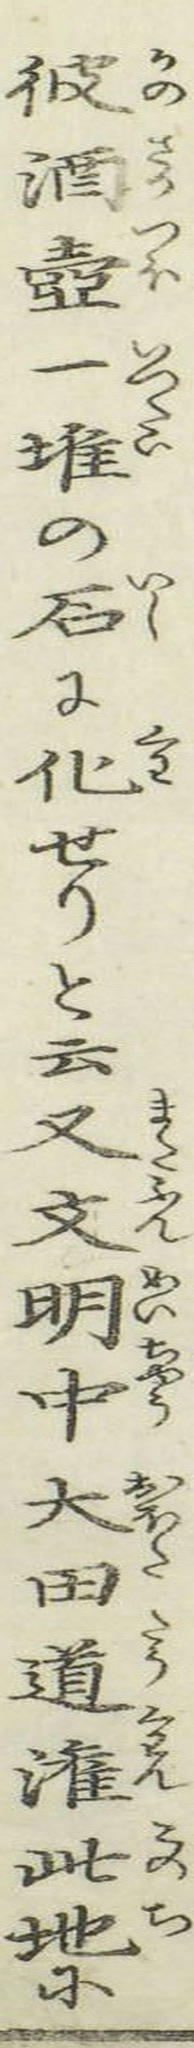彼酒壺一堆の石に化せりと云又文明中太田道灌此地に
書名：江戸名所図会 20巻 巻之3
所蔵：東京学芸大学教育コンテンツアーカイブ
